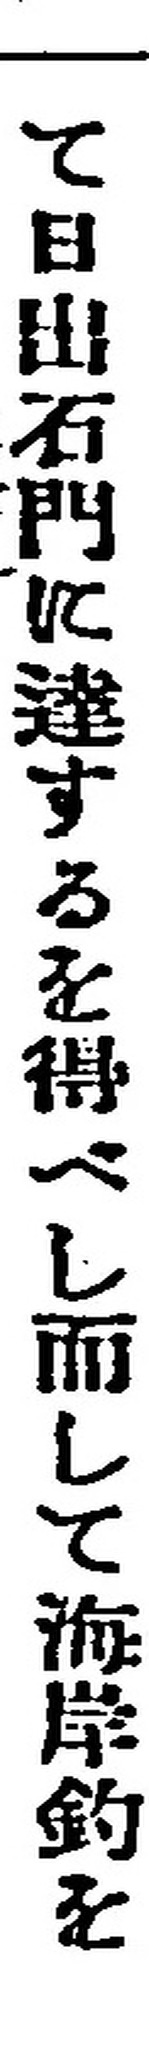て日出石門に達するを得べし而して海岸釣を
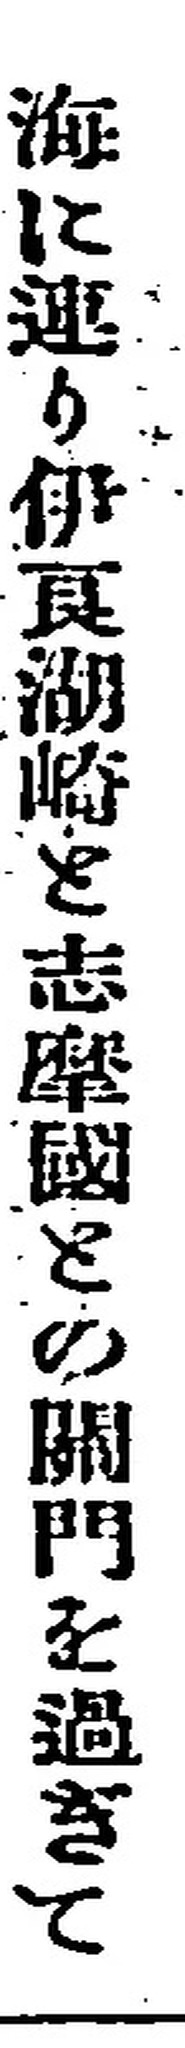海に連り伊良湖崎を志摩国との関門を過ぎて
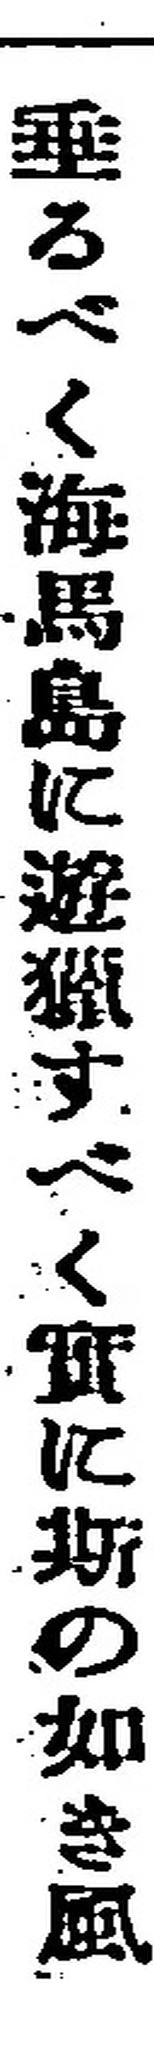垂るべく海馬島に遊猟すべく実に斯の如き風
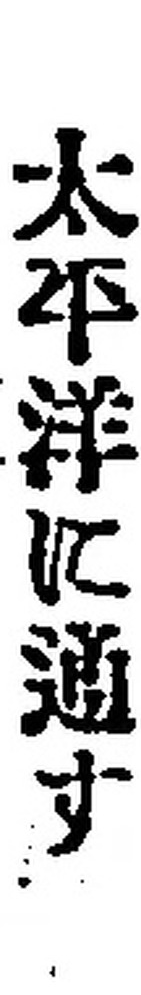太平洋に通す
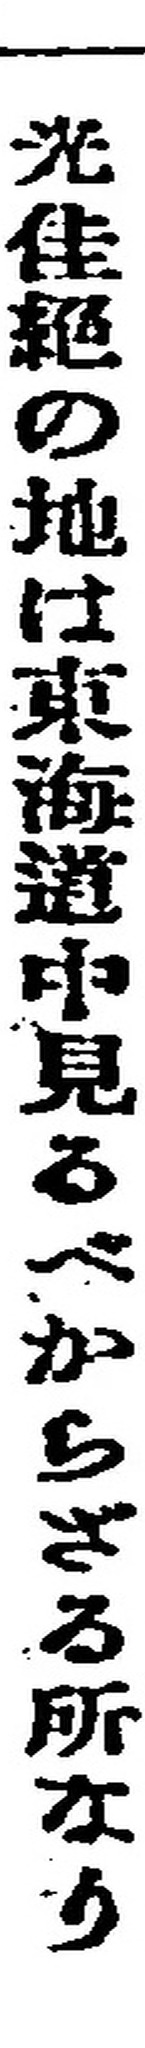光佳絶の地は東海道中見るべからざる所なり

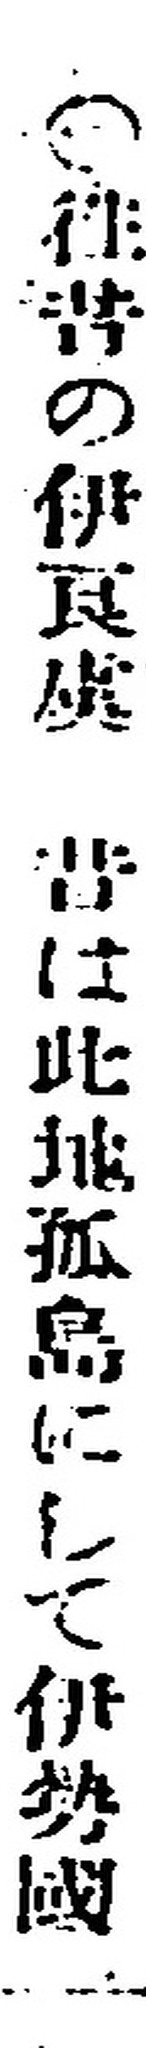○往昔の伊良虞昔は此地孤島にして伊勢国
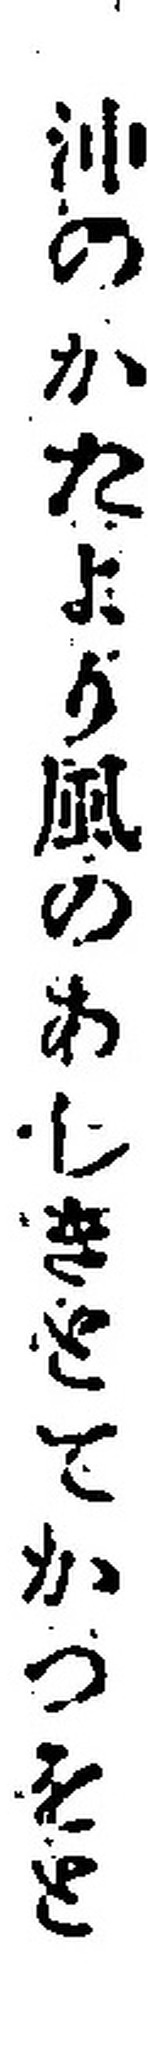沖のかたより風のあしきとてかつをと
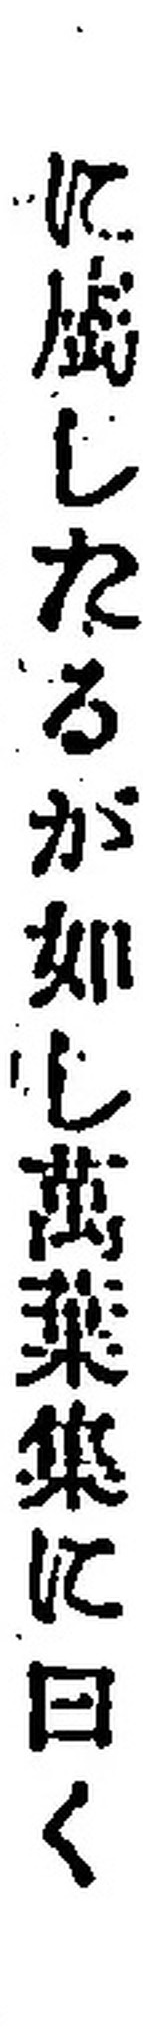に属したるが如し万葉集に曰く
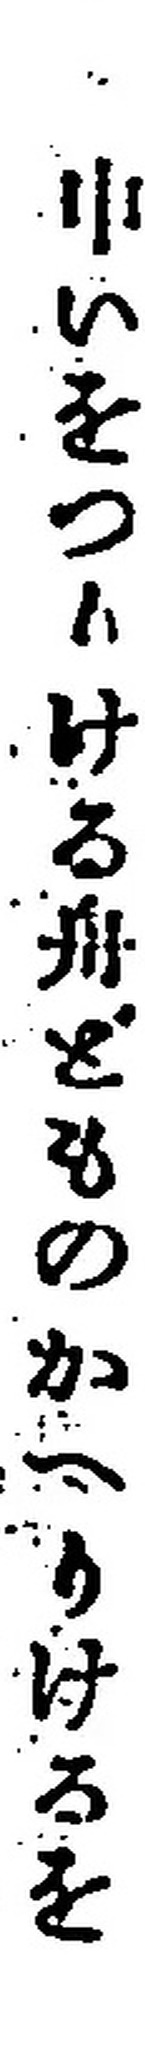申いをつりける舟どものかへりけるを
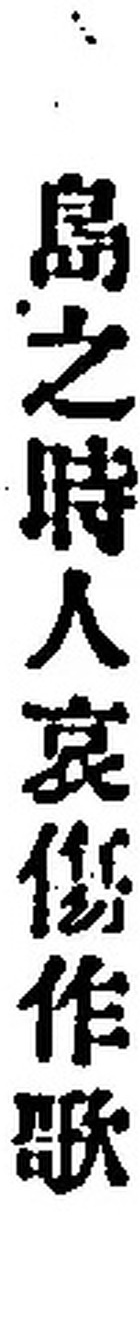島之時人哀傷作歌
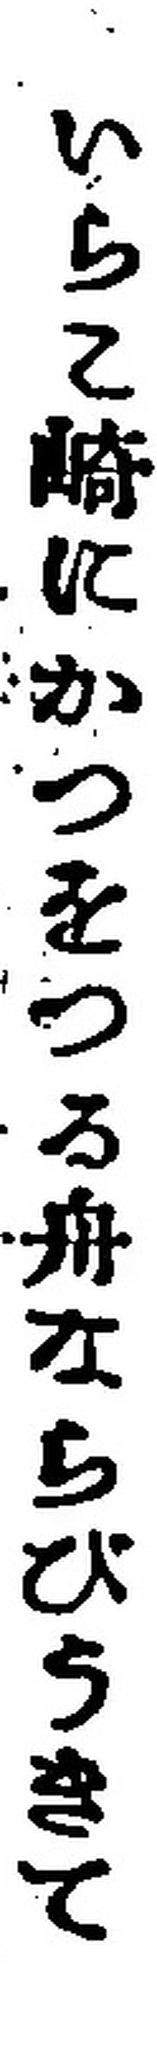いらこ崎にかつをつる舟ならびうきて
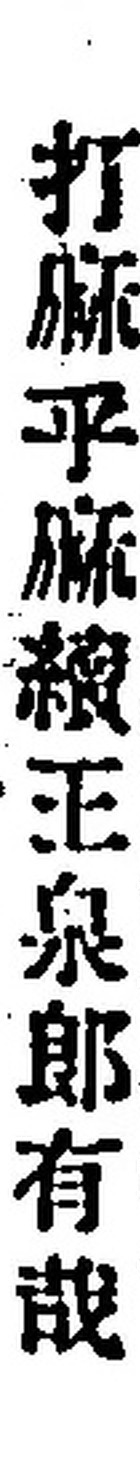打麻乎麻続王泉郎有哉
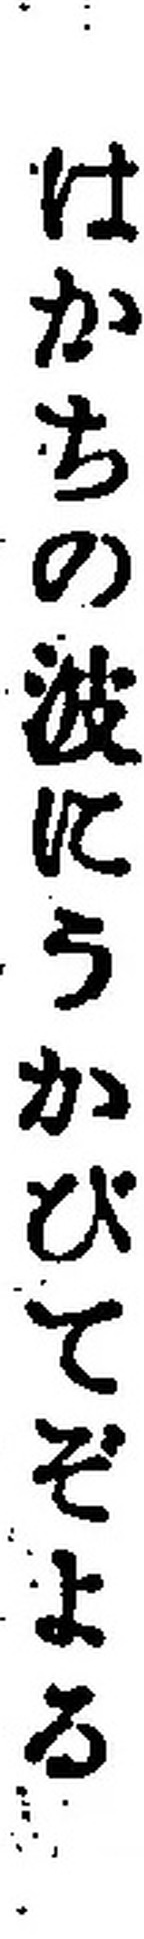はかちの波にうかびてぞよる
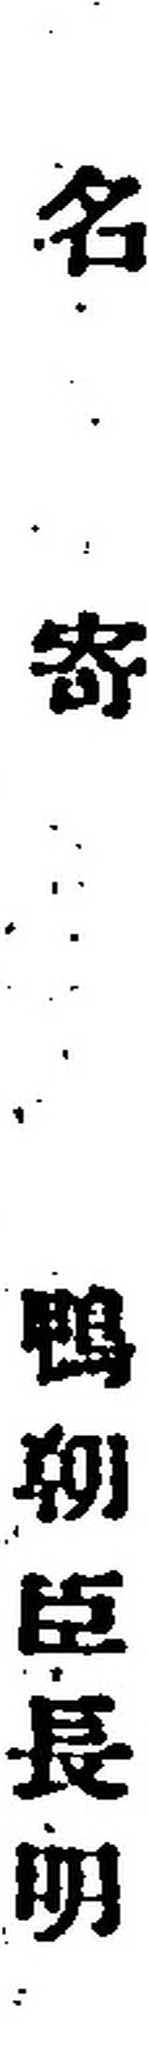名寄鴨朝臣長明
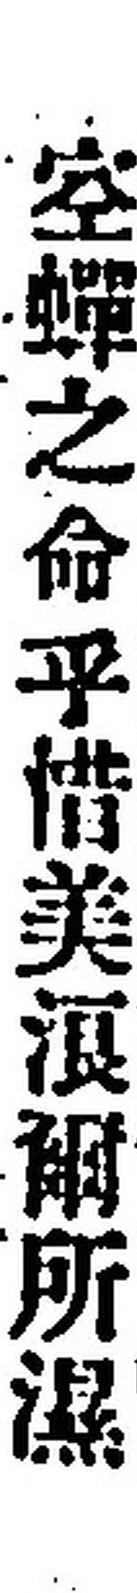空蝉之命乎惜美浪爾所湿
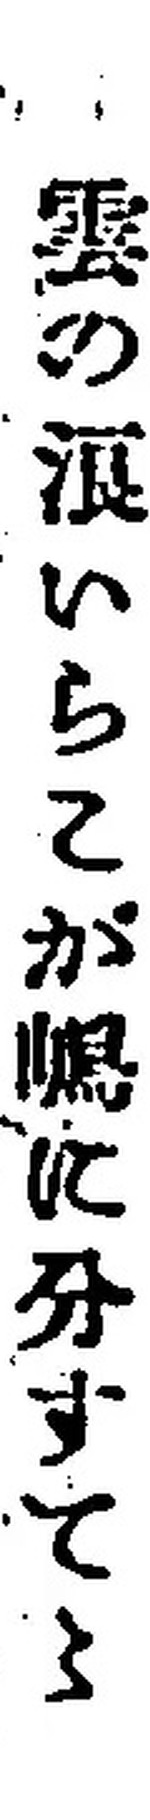雲の浪いらこが嶋に分すてゝ
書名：東参名勝案内
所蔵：国立国会図書館 National Diet Library, JAPAN
